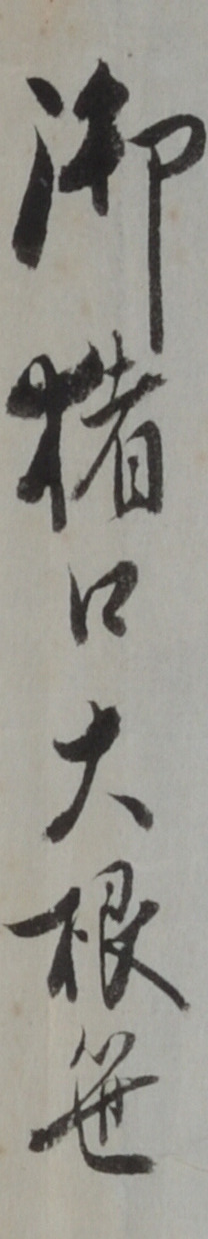御猪口大根笹
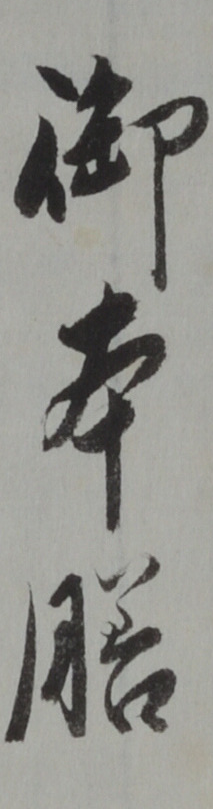御本膳
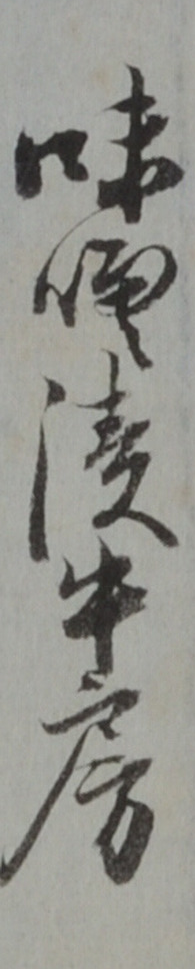味噌漬牛房
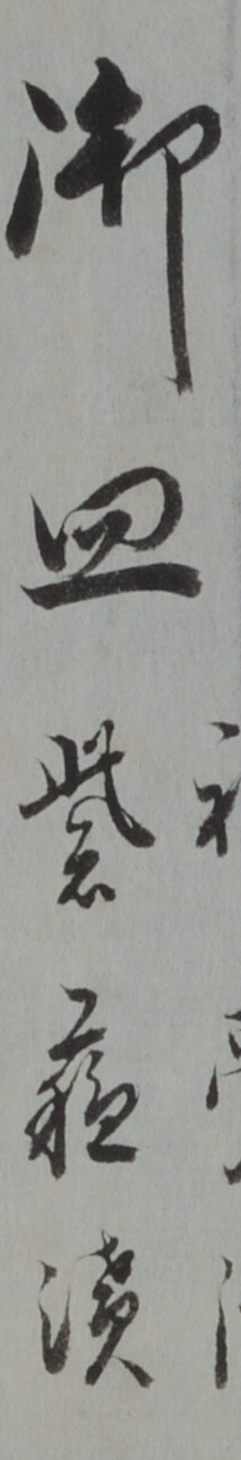御皿初夢漬
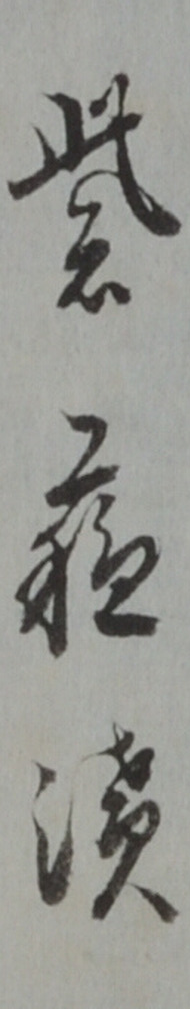紫蘇漬
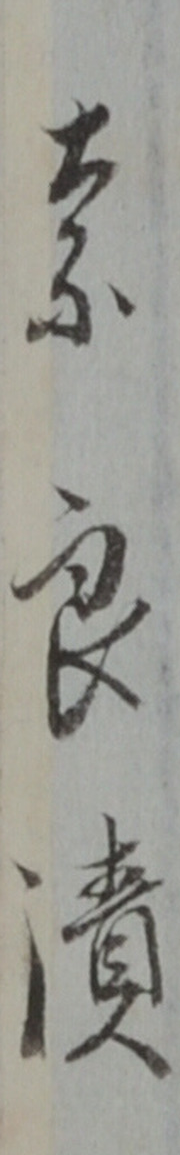奈良漬
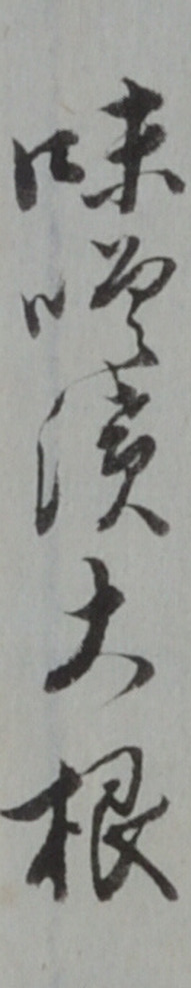味噌漬大根
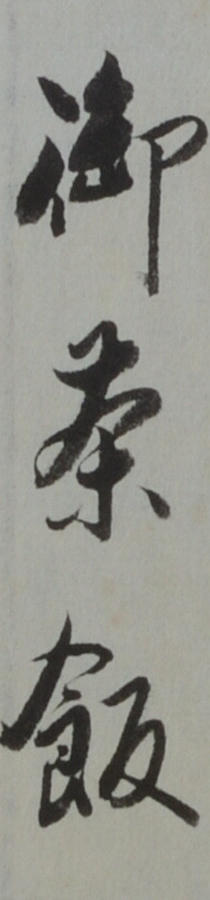御茶飯
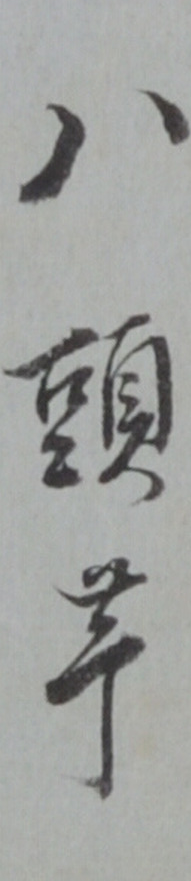八頭芋

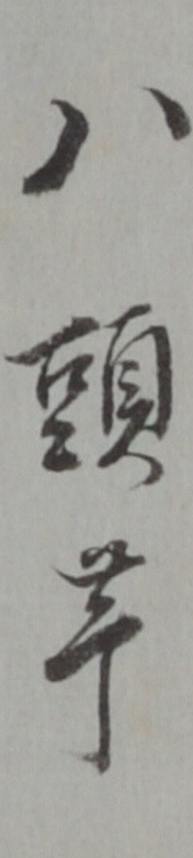八頭芋
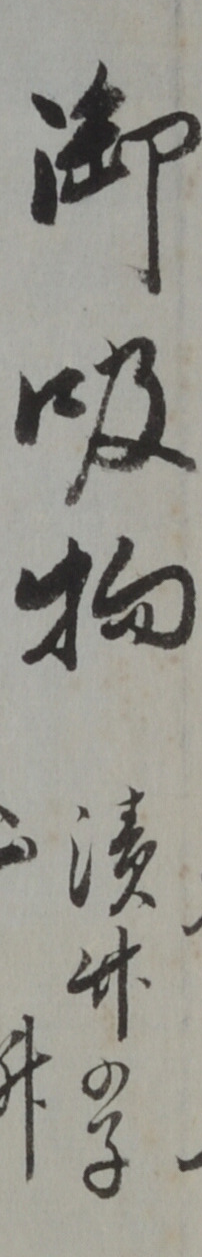御吸物漬竹の子
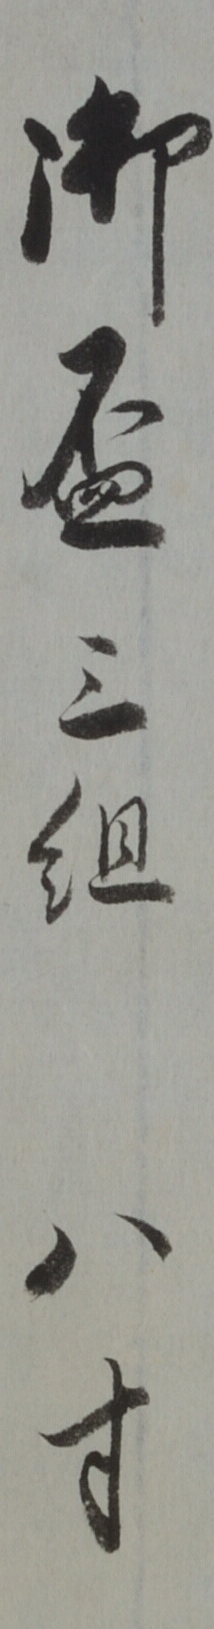御盃三組八寸
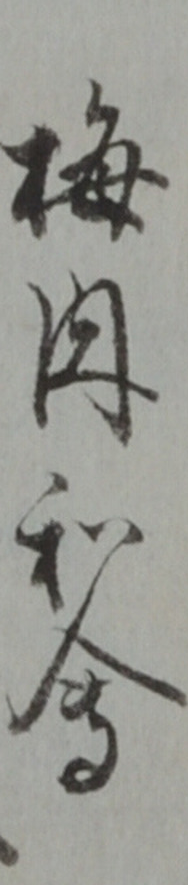梅肉和会
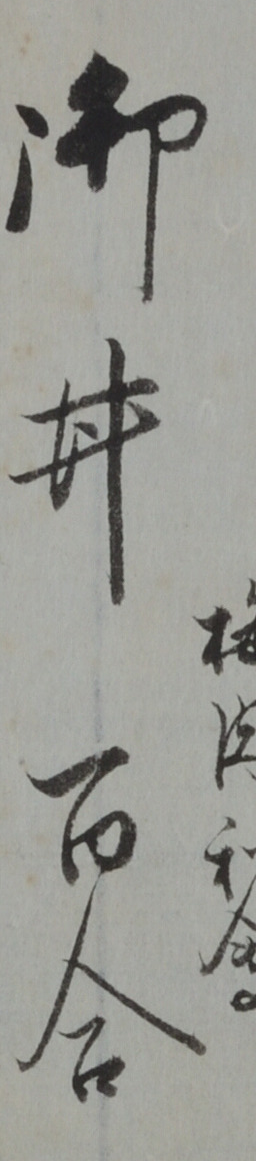御丼百合
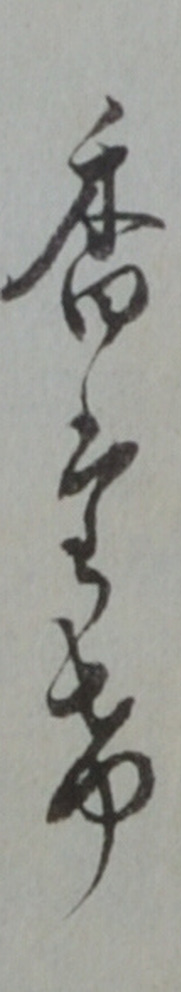香たけ
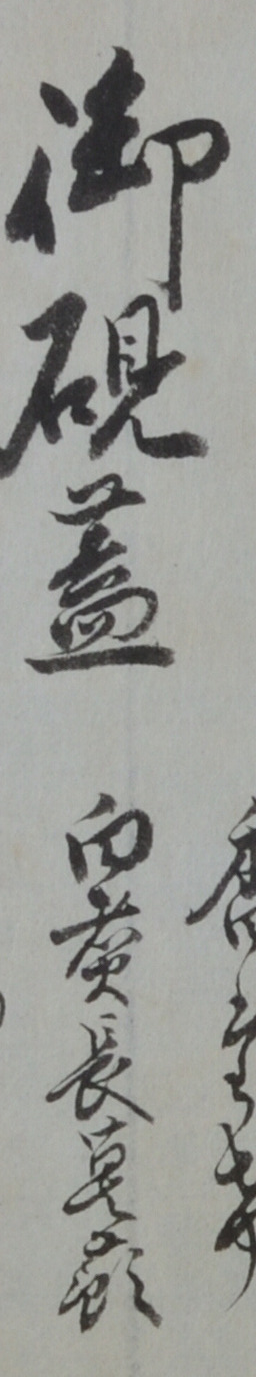御硯蓋白煮長薯蕷
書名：献立書上
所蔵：伊那市立高遠町図書館・合同会社AMANE
